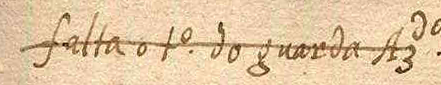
falta o to. do guarda Azdo.
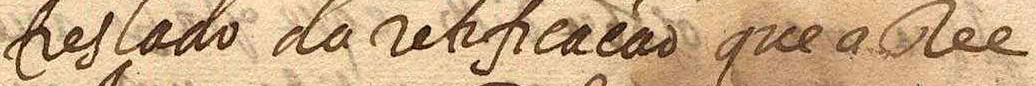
treslado da retificação que a Ree
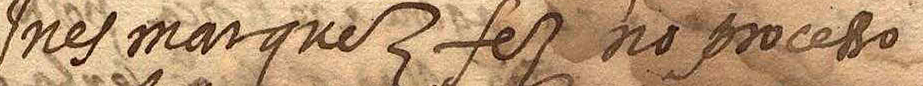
Jnes marqueZ fez no processo
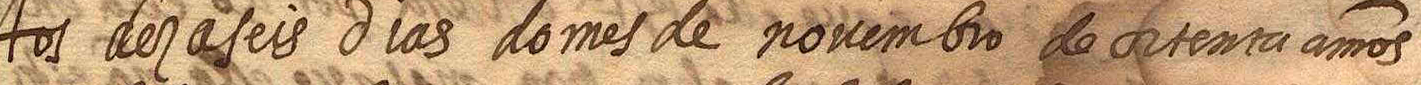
Aos dezaseis dias do mes de nouembro de oitenta an̄nos
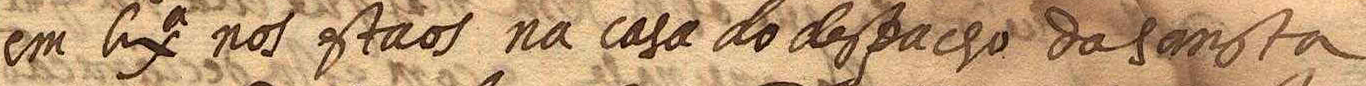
em lixa nos estaos na casa do despacho da sancta
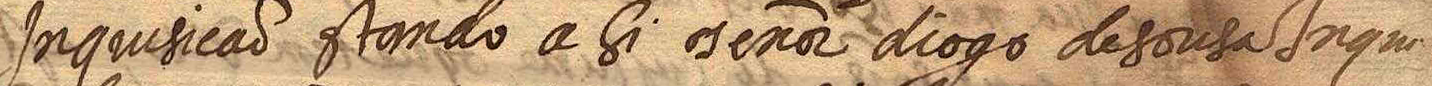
Jnquisição estando ahi o sen̄or diogo de sousa Inqui
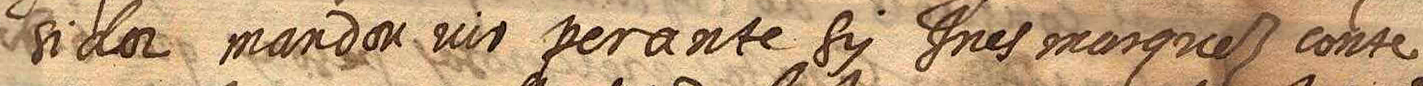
sidor mandou uir perante sy Ines marquez conte
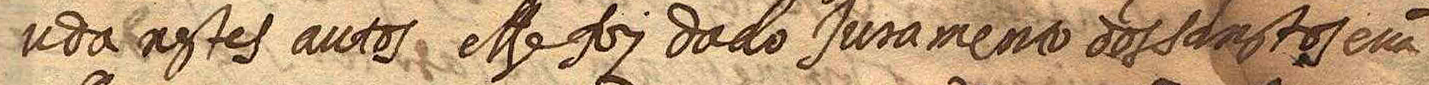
uda nestes autos e lhe foy dado Juramento dos sanctos euā
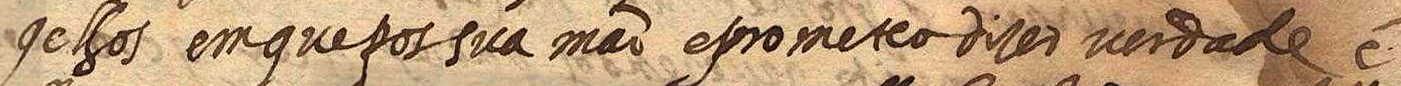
gelhos em que pos sua mão e prometeo dizer uerdade e
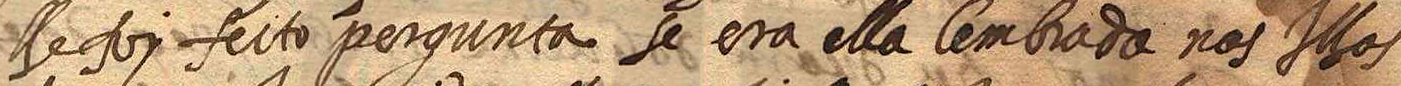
lhe foy feito pergunta se era ella lembrada nas Ilhas
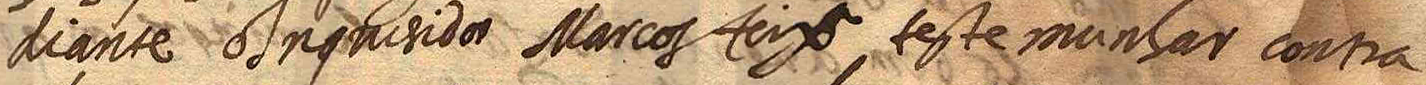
diante o Inquisidor Marcos teixa. testemunhar contra
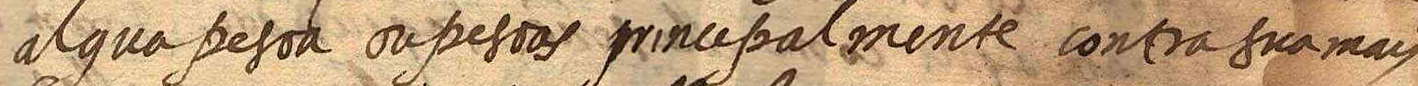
algua pesoa ou pesoas principalmente contra sua may
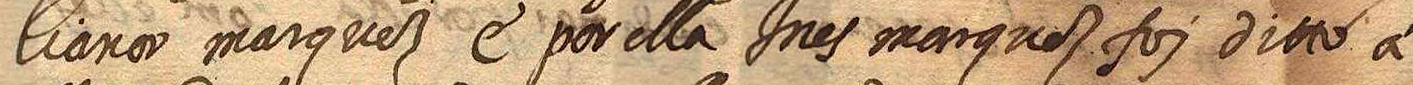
lianor marquez e por ella Ines marquez foj ditto a
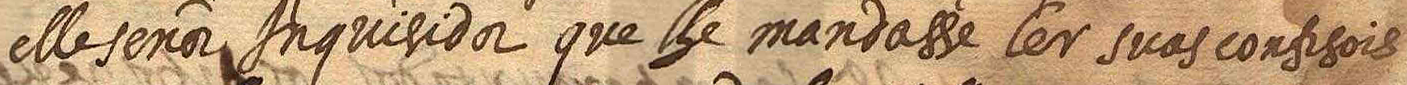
elle senōr Inquisidor que lhe mandasse ler suas confisois
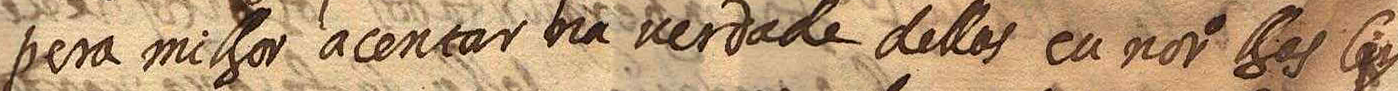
pera milhor acentar na uerdade dellas eu noto lhas l_y
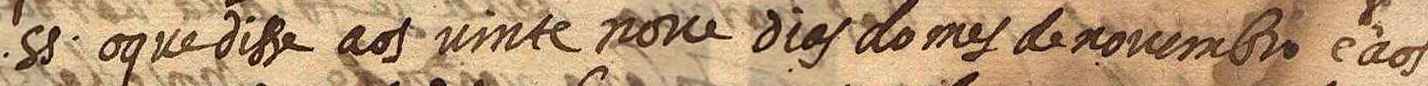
.ss. o que disse aos uinte noue dias do mes de nouembro e aos
